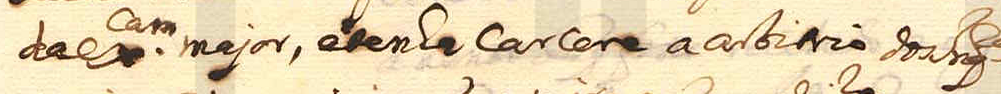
de ex.cam major, e tenha carcere a arbitrio dos Inqres
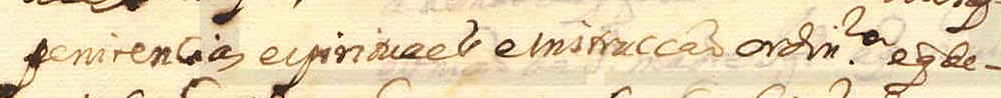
penitencias esprituaes e instrucçaõ ordin.ra e q̄ de
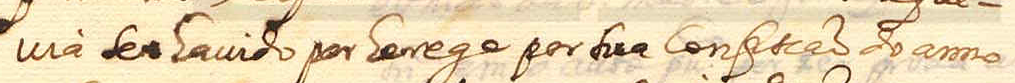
uia ser hauido por herege por sua confisçaõ do anno
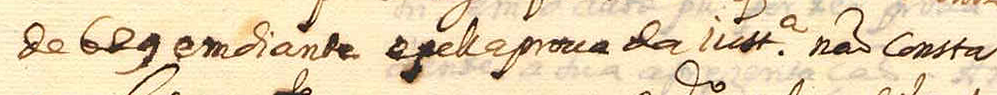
de 629 em diante e pella proua da iust.a naõ consta
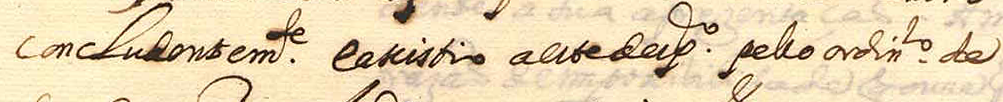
concludentem.te e assistio a este desp.o pello ordinro. de
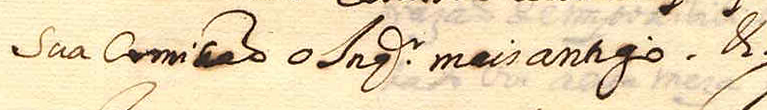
sua comiçaõ o Inq.or mais antigo. &
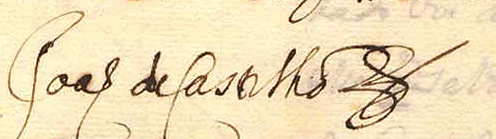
João de Castilho
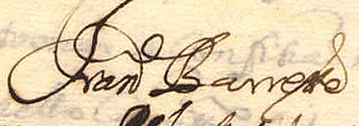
Fran.co Barretto
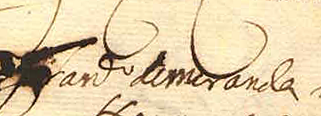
franco de miranda
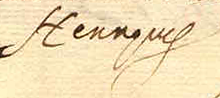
Henriques
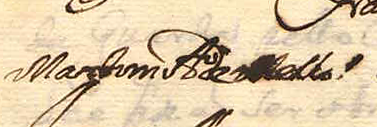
Martim Ao de Mello
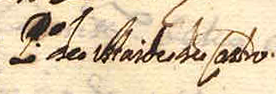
Po de Ataide de Castro
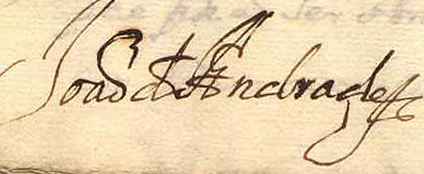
João d̄ Andrade
